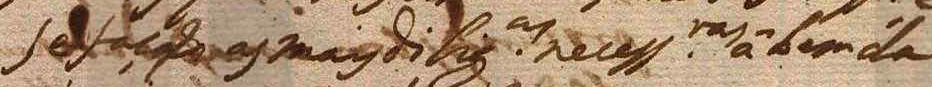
se façaõ as mais dilig.as necess.ras á bem da
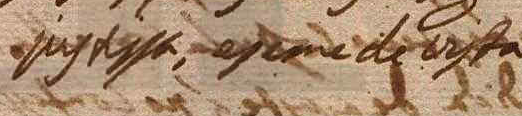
justissa, e se me de vista
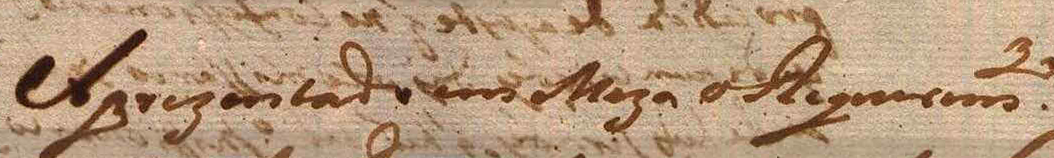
Aprezentado em Meza o Requerim.to
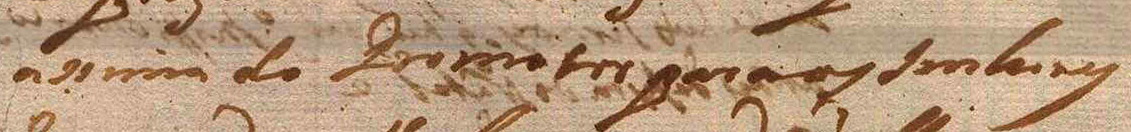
assima do Promotor para os senhores
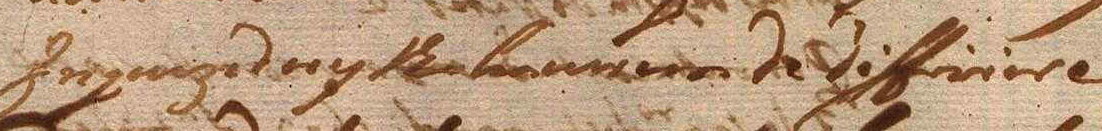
Jnquizidores lhe hauerem de diffirir e
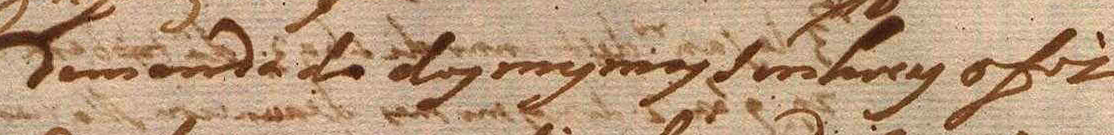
de mandado dos mesmos senhores o fiz
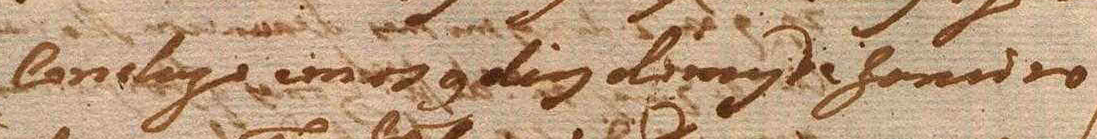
concluzo em os 9 dias do mes de Janeiro
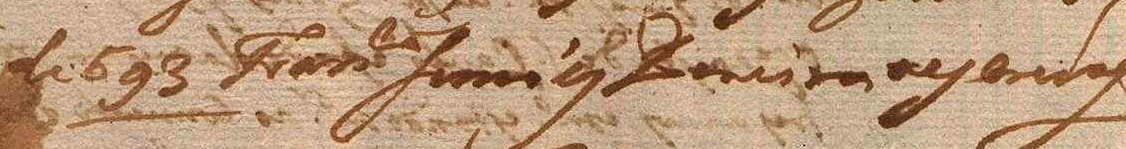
de 693 Fran.co Simoẽs Pereira o escrevy
